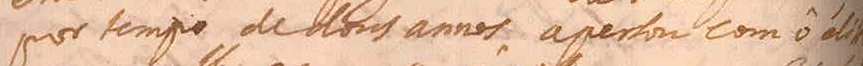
por tempo de dous annos apertou com ô ditto
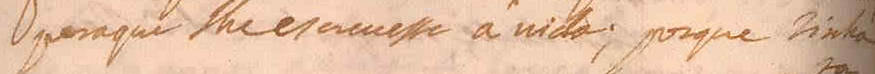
pera que lhe escreuesse á uida; porque tinha
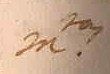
mtas
